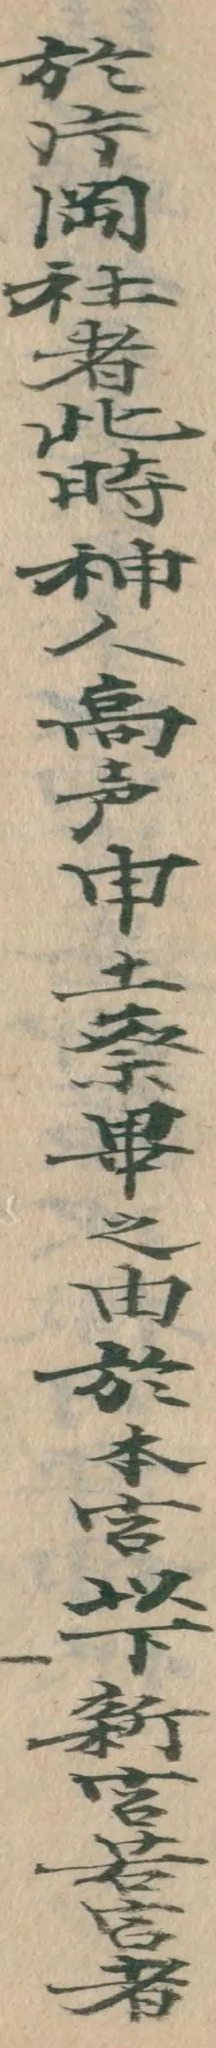於片岡社者此時神人高声申土祭畢之由於本宮以下新宮若宮者
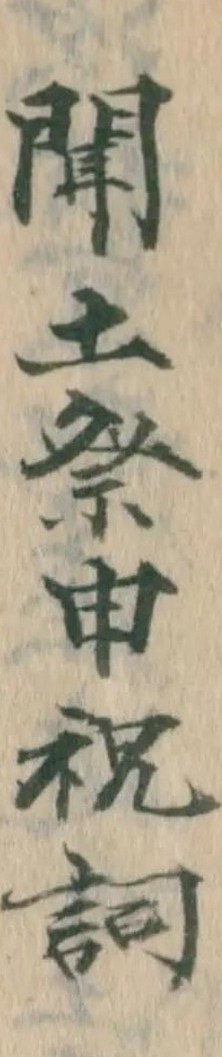聞土祭申祝詞

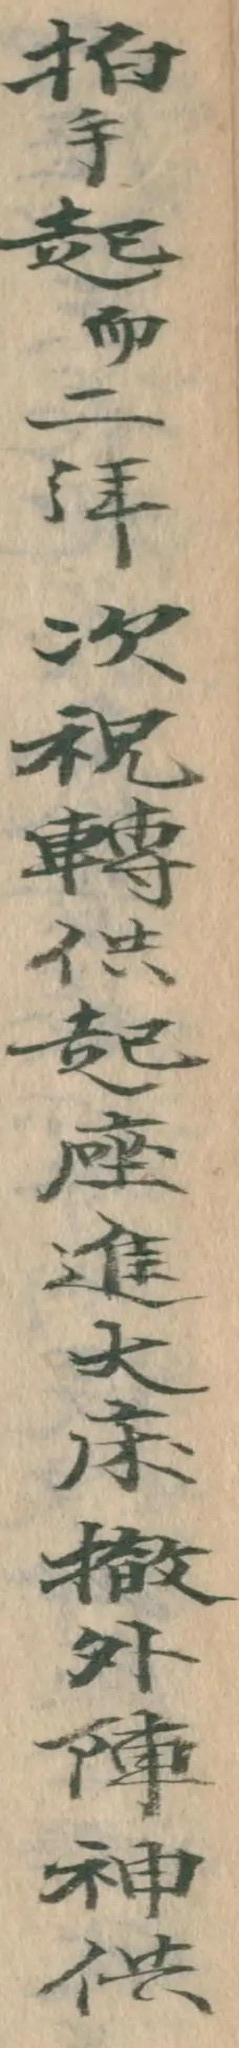柏手起而二拝次祝転供起座進大床撤外陣神供
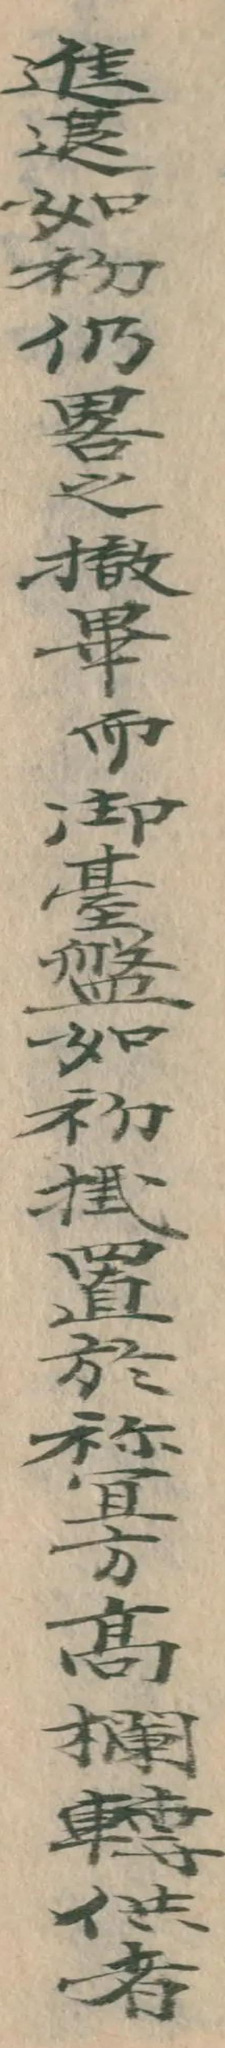進退如初仍略之撤畢而御台盤如初掛置於称宜方高欄転供者
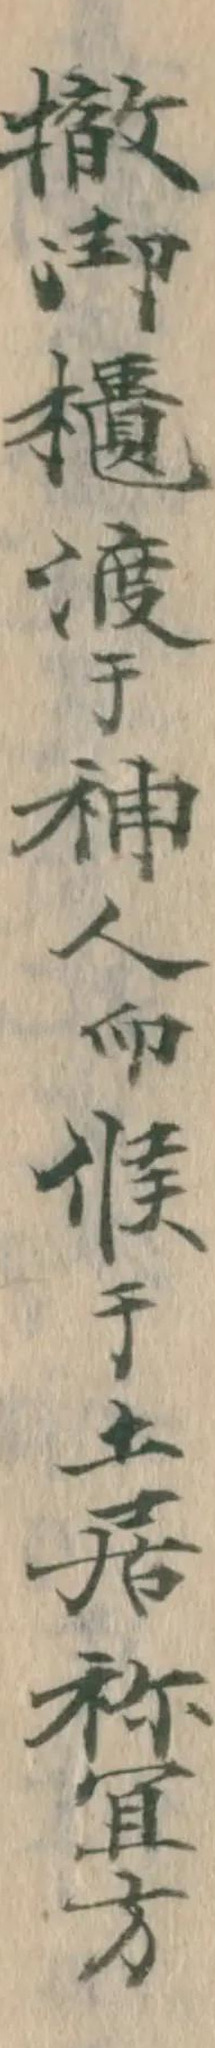撤御櫃渡于神人而候于土居称宜方
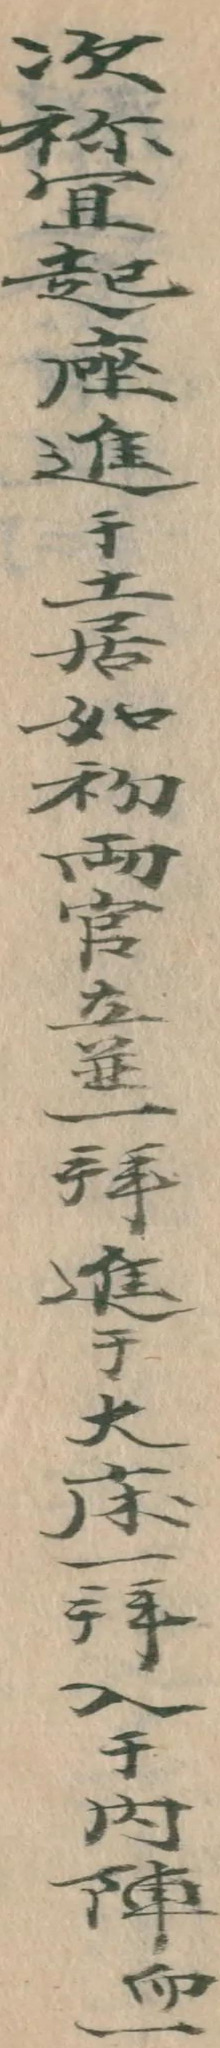次祢宜起座進于土居如初両官立並一拝進于大床一拝入于内陣而一
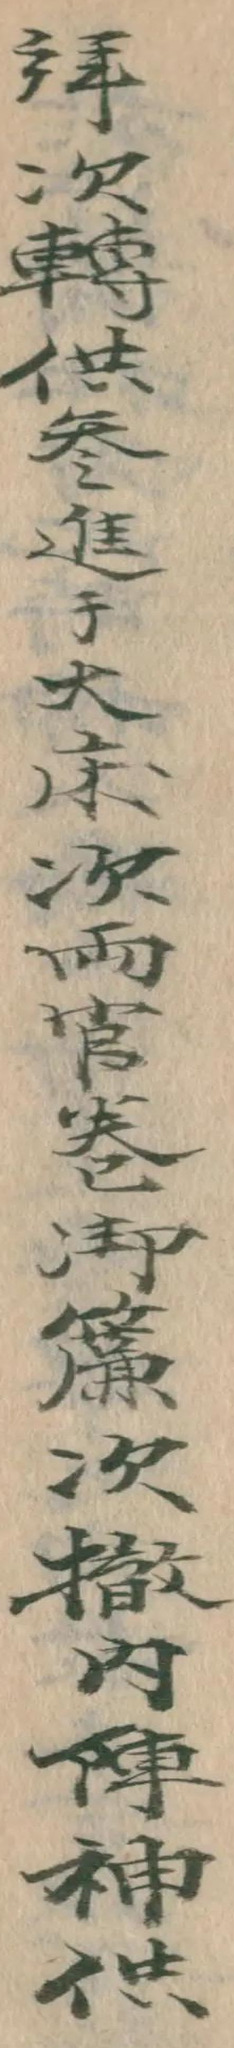拝次転供参進于大床次両官巻御簾次撤内陳神供
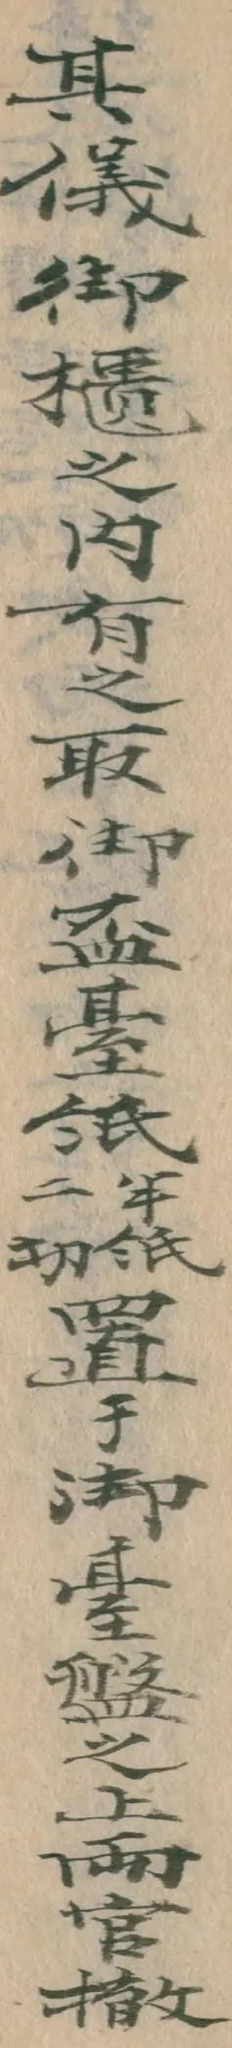其儀御櫃之内有之取御盃台紙半紙二切置于御台盤之上両官撤
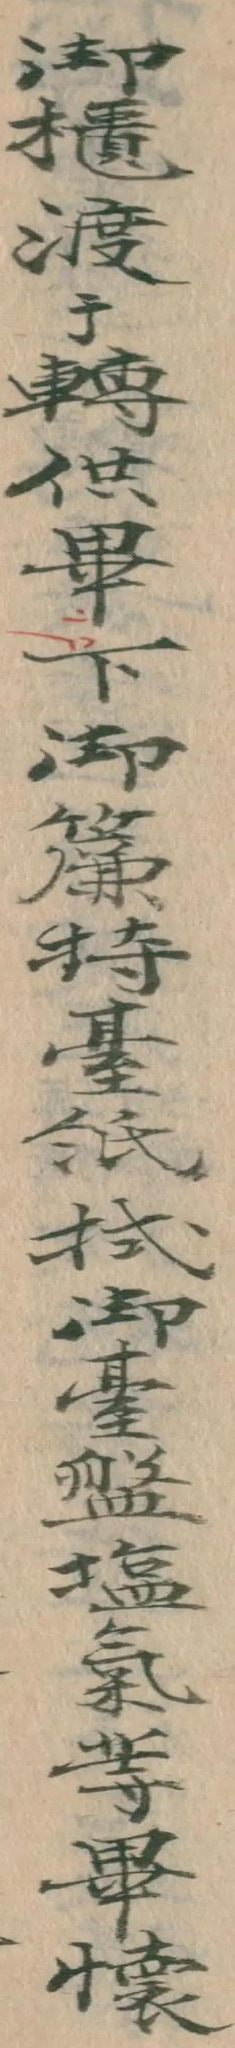御櫃渡于転供畢(下御簾持台紙拭御台盤塩気等畢懐
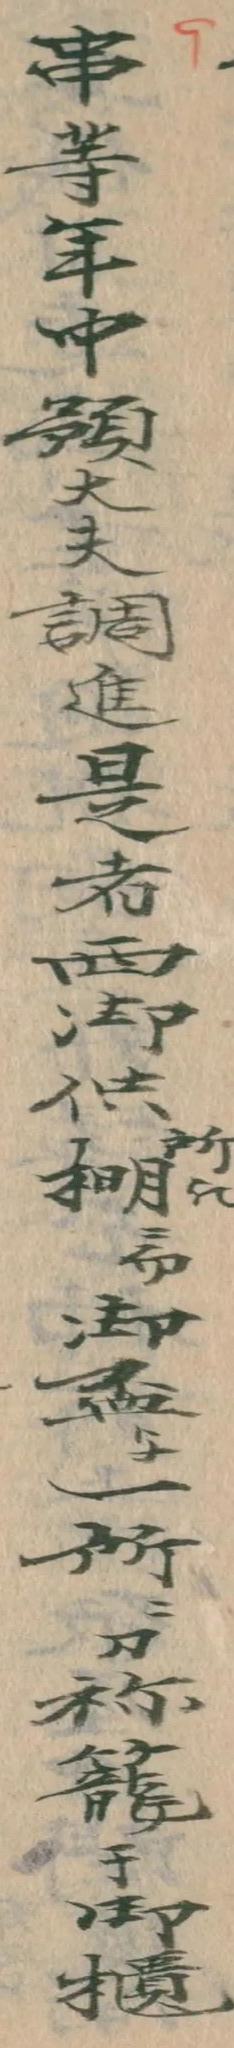串等年中預大夫調進是者西御供棚ニ而御盃与一所ニ刀祢籠于御櫃
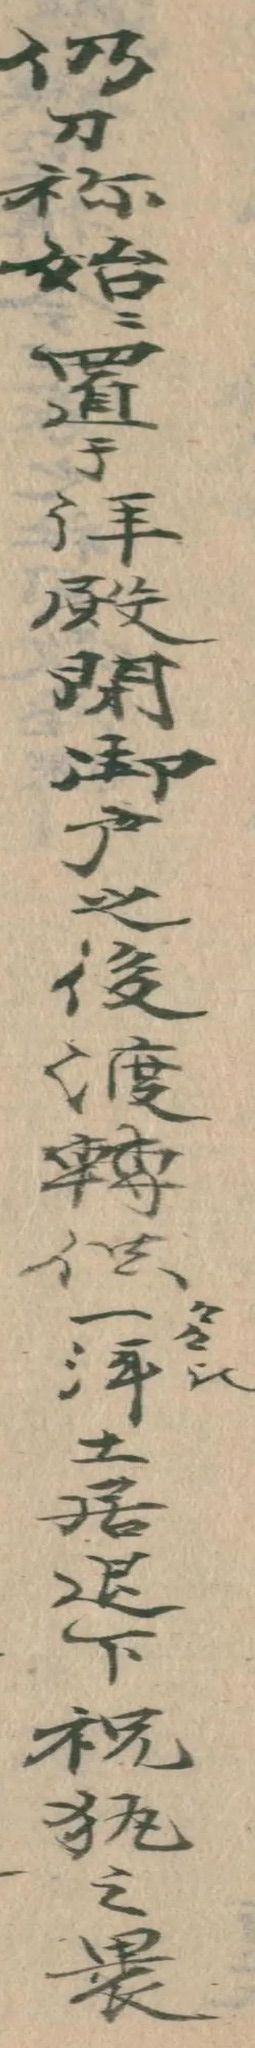仍刀祢始ニ置于拝殿閉御戸之後渡転供一拝土居退下祝執之裹
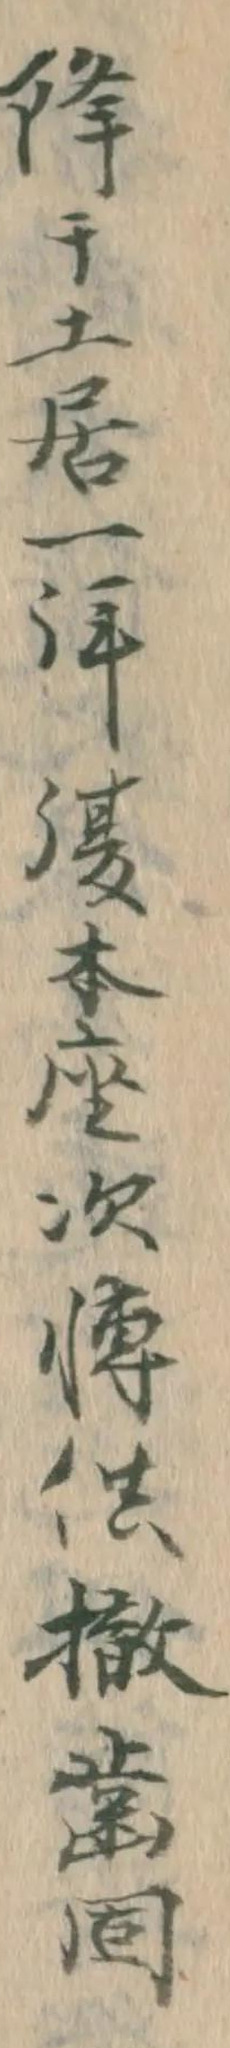降于土居一拝復本座次転供撤歯固
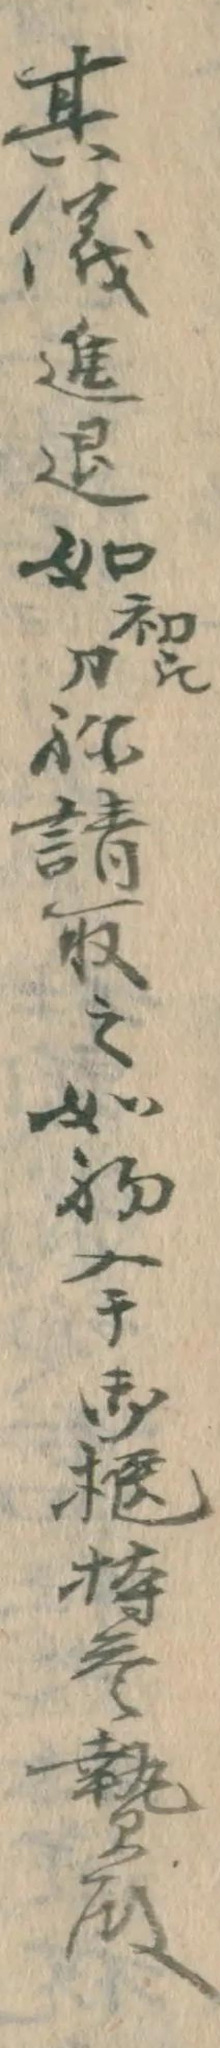其儀進退如刀祢請取之如初入于御櫃持参贄殿
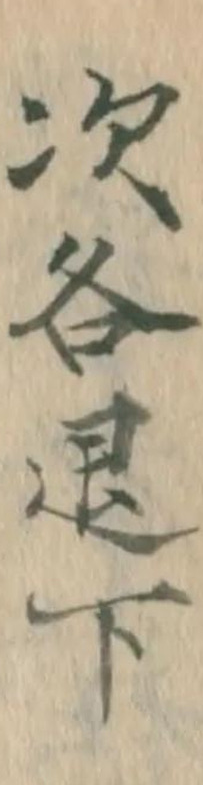次各退下
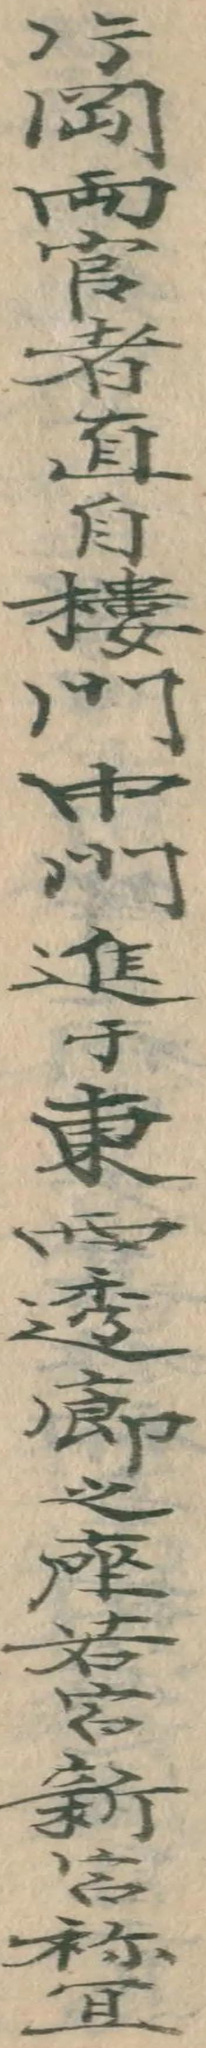片岡両官者直自楼門中門進于東西透廊之座若宮新宮称宜
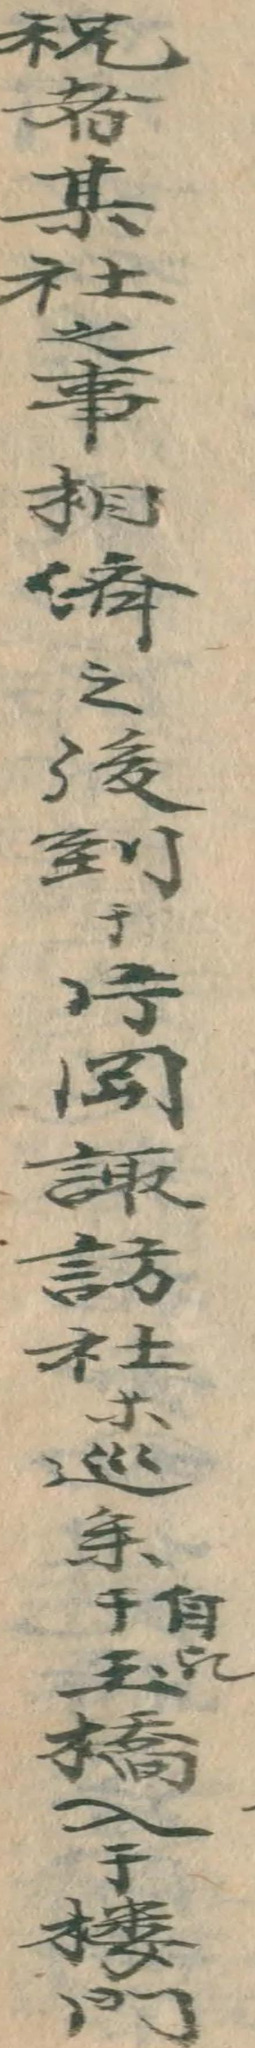祝者某社之事相済之後到于片岡諏訪社等巡参于玉橋入于楼門
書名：賀茂社記録. 第9冊
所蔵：国立国会図書館 National Diet Library, JAPAN
